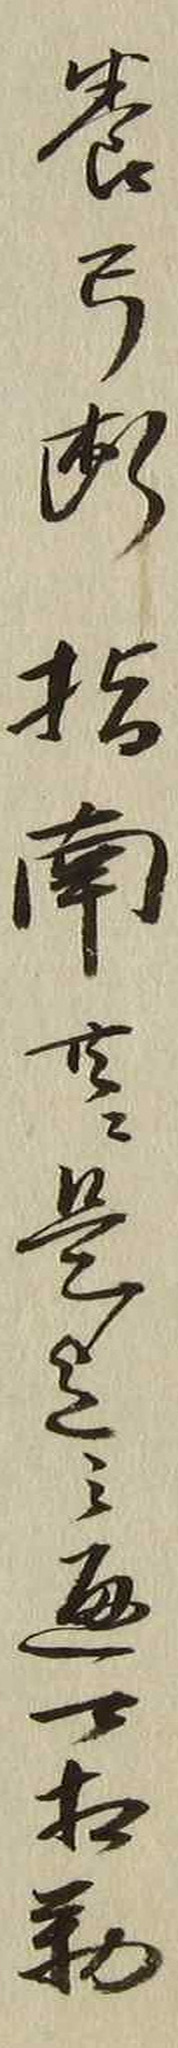養弓術指南共ニ是迄之通可相勤
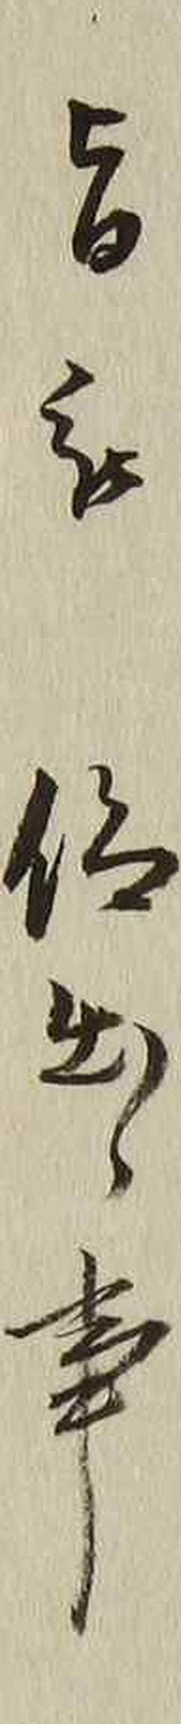旨被仰出候事
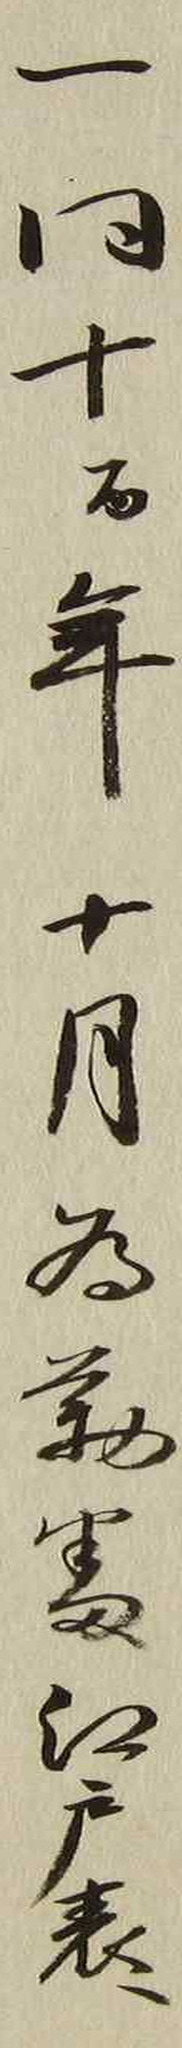一同十酉年十月為勤番江戸表へ
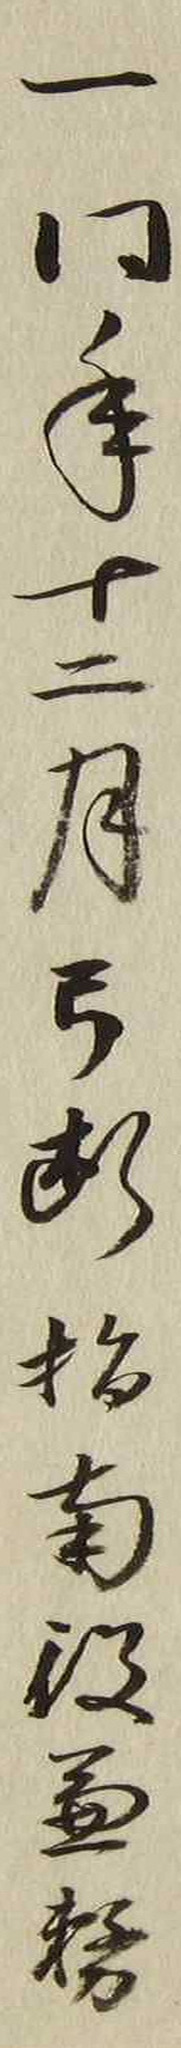一同年十二月弓術指南役兼務
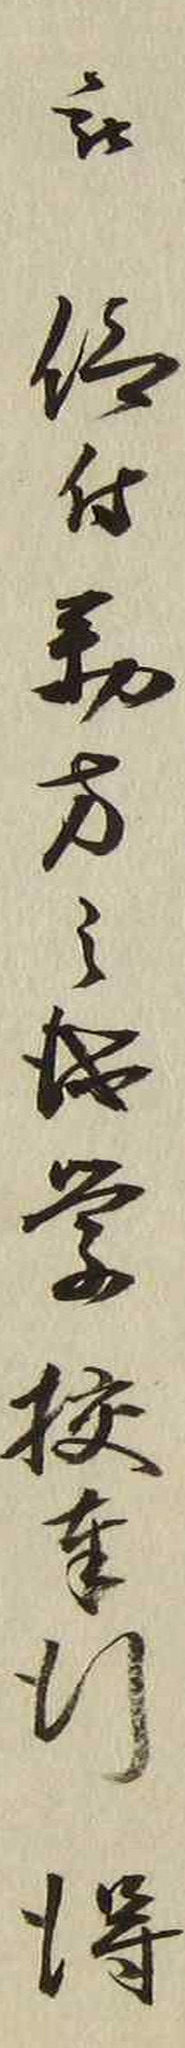被仰付勤方之儀学校奉行得
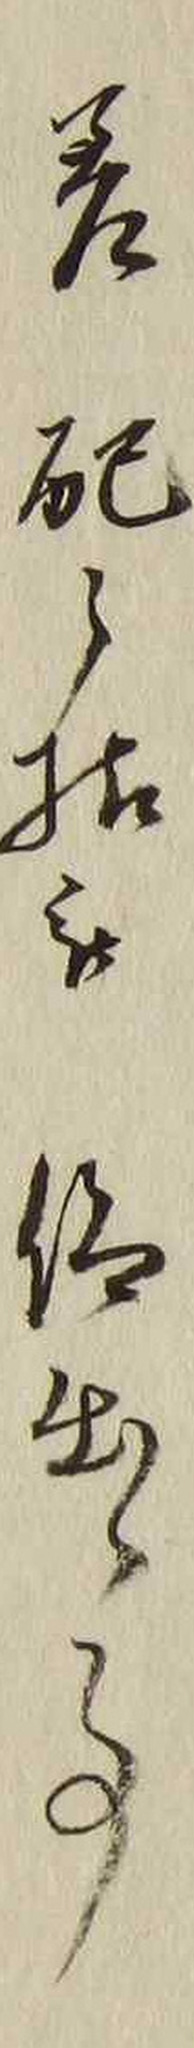差配々様被仰出候事
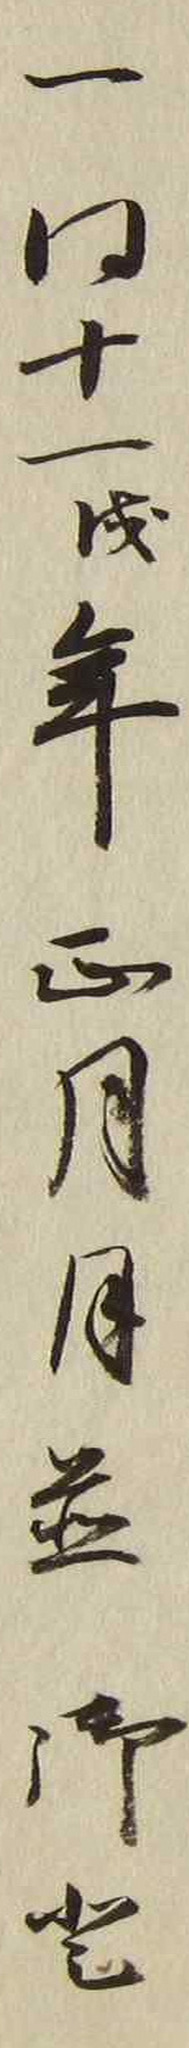一同十一戌年正月月並御登

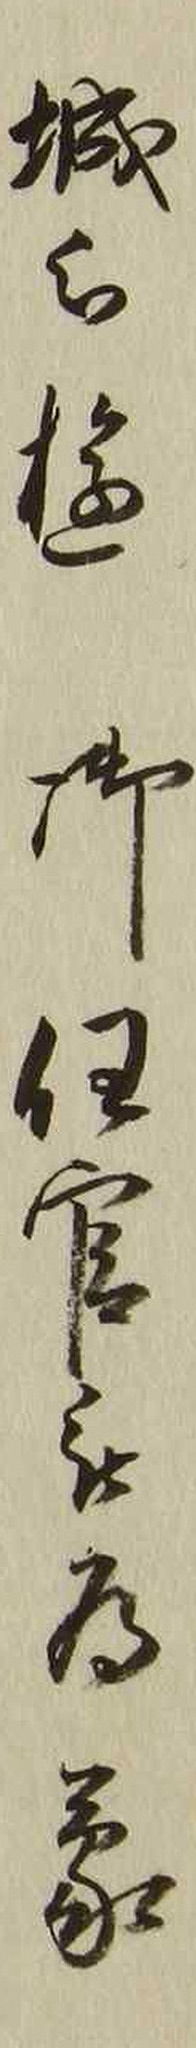城被遊御任官被為蒙
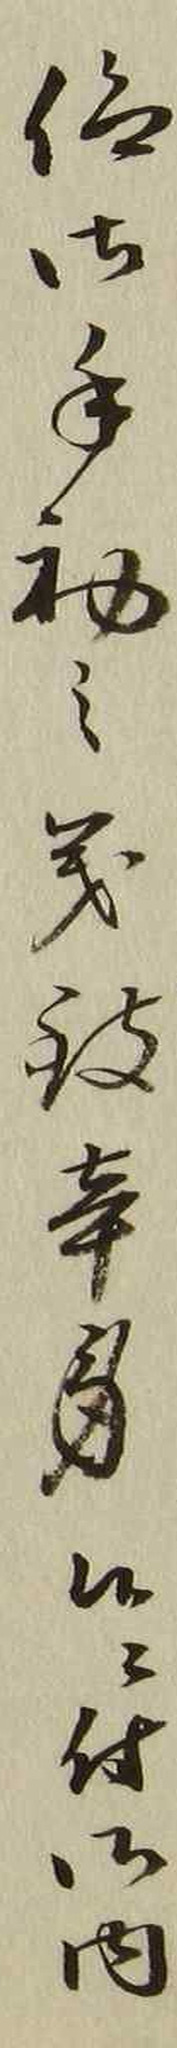仰御手初之義致辛労候ニ付御内
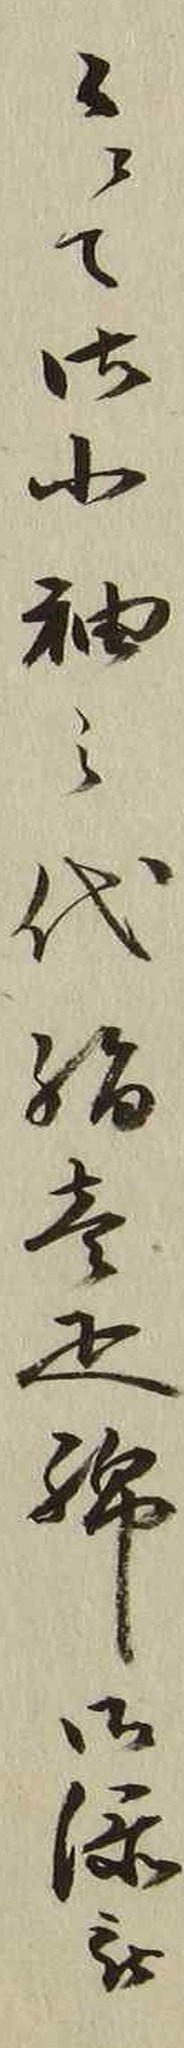々ニて御小袖之代絹壱疋綿御添被
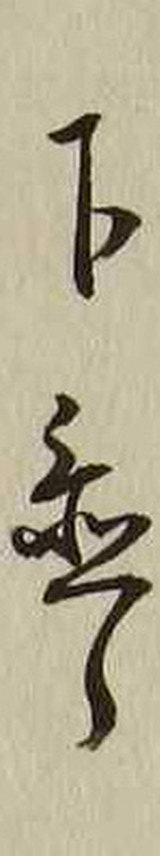下置候
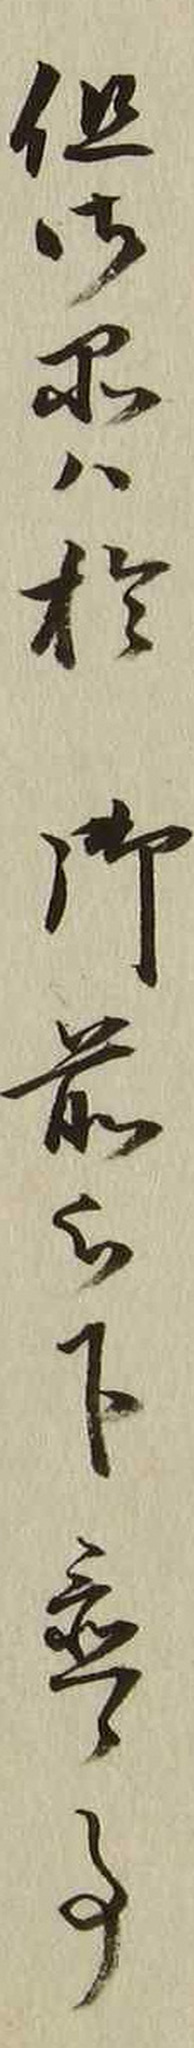但御品ハ於御前被下置候事
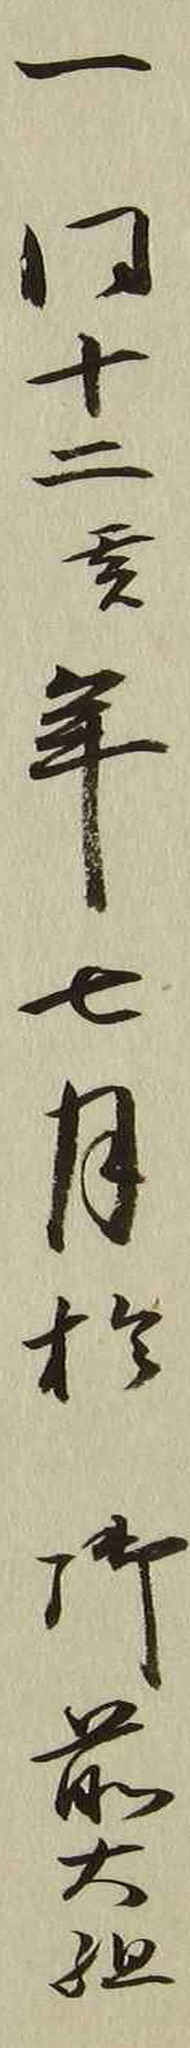一同十二亥年七月於御前大組
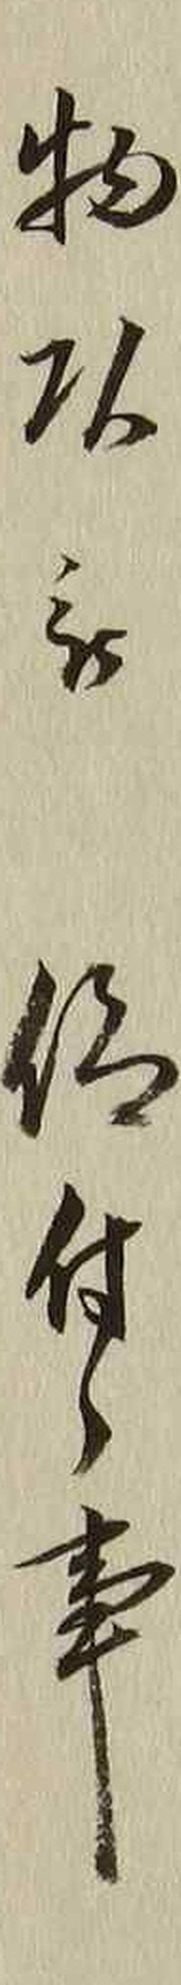物頭被仰付候事
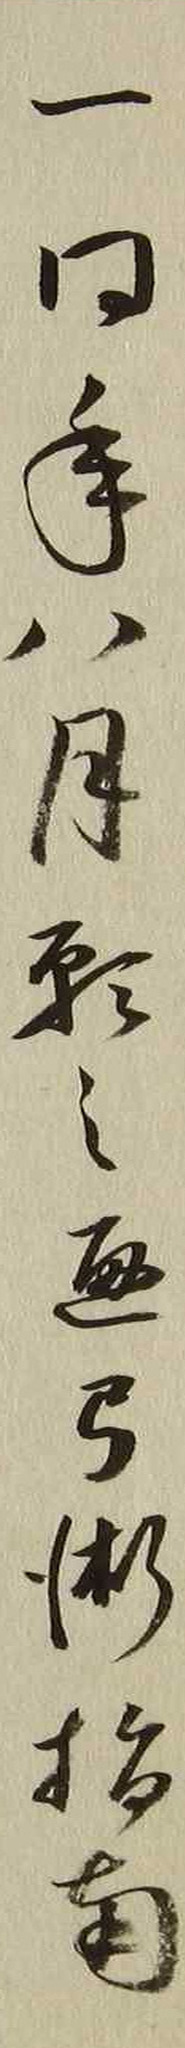一同年八月願之通弓術指南
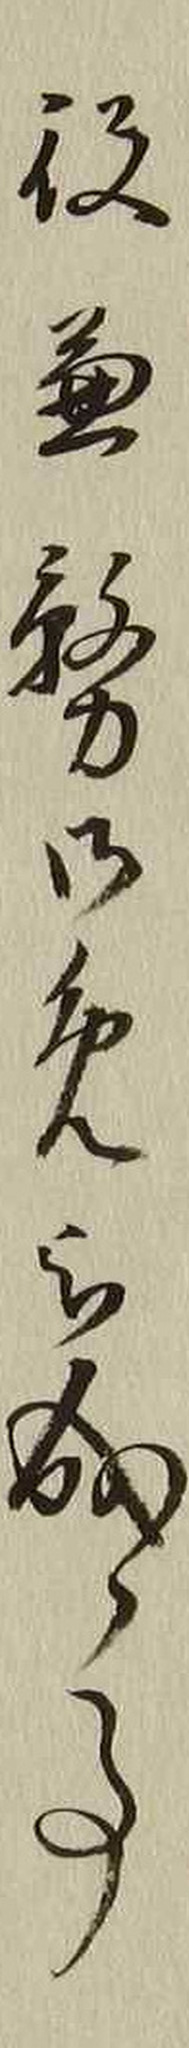役兼務御免被成候事
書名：諸士系譜　巻之69　を之部3
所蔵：会津若松市立会津図書館
